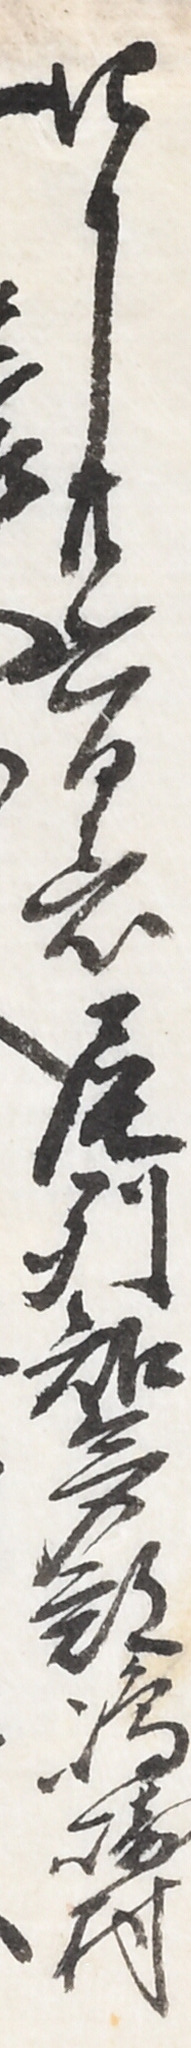四月廿六日着尾州知多郡嶋崎村
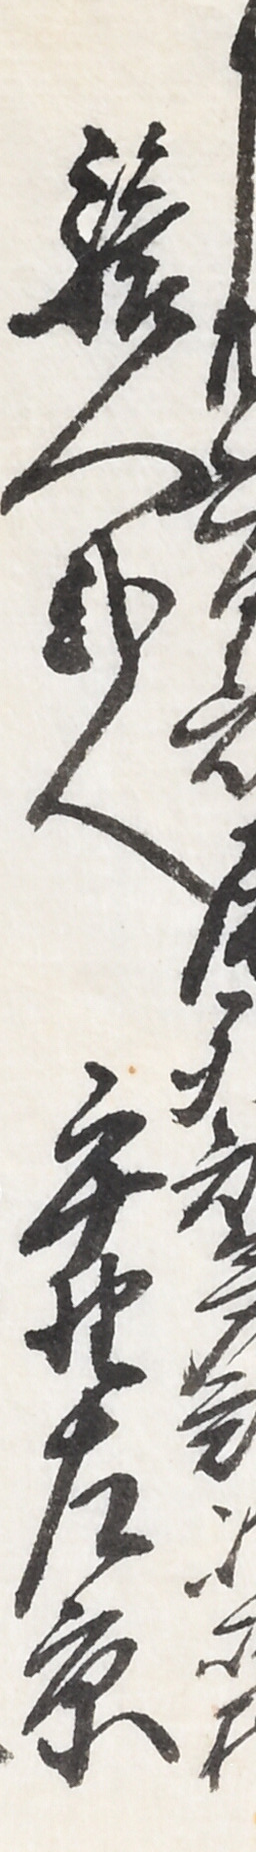一旅人弐人平野左京
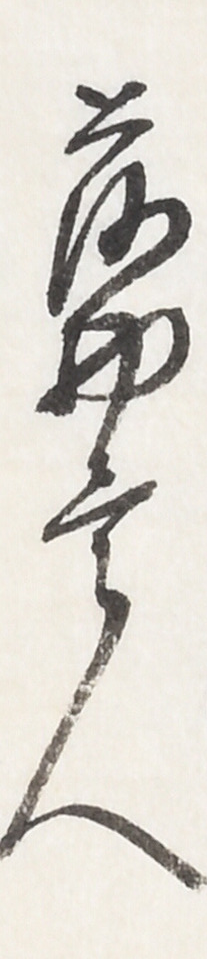荷物壱人
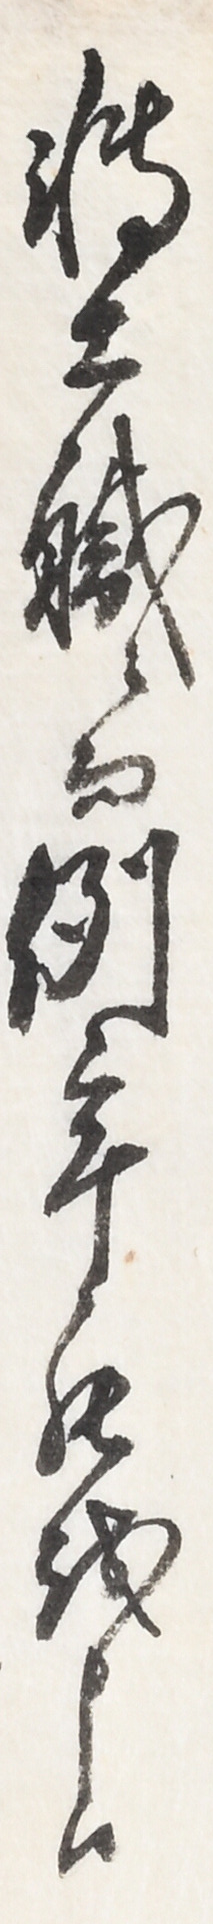転士職ニ而例年罷越申候
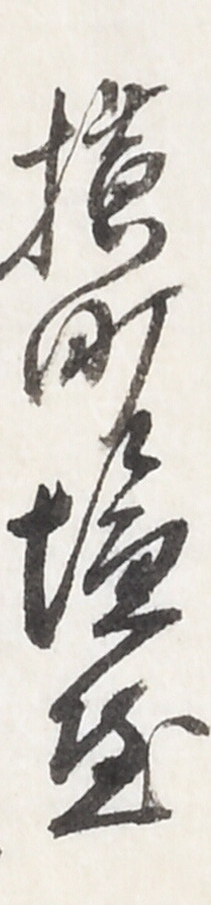横町塩屋
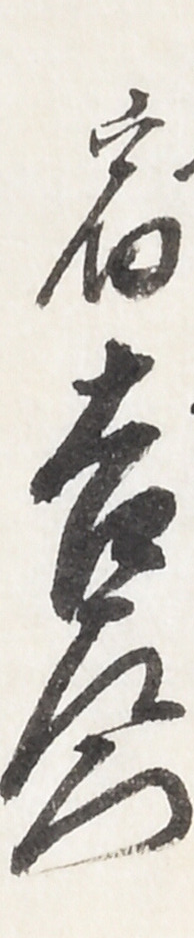宿吉左衛門
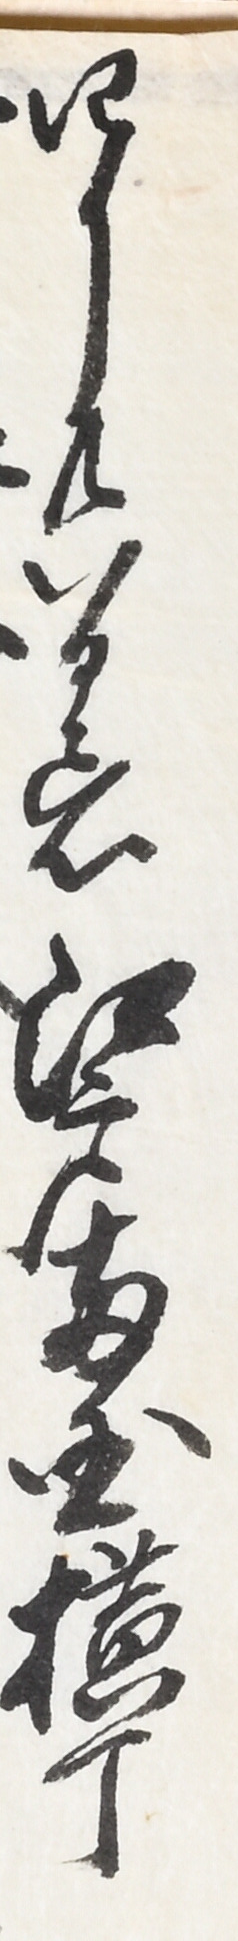四月廿八日着江戸両国横丁
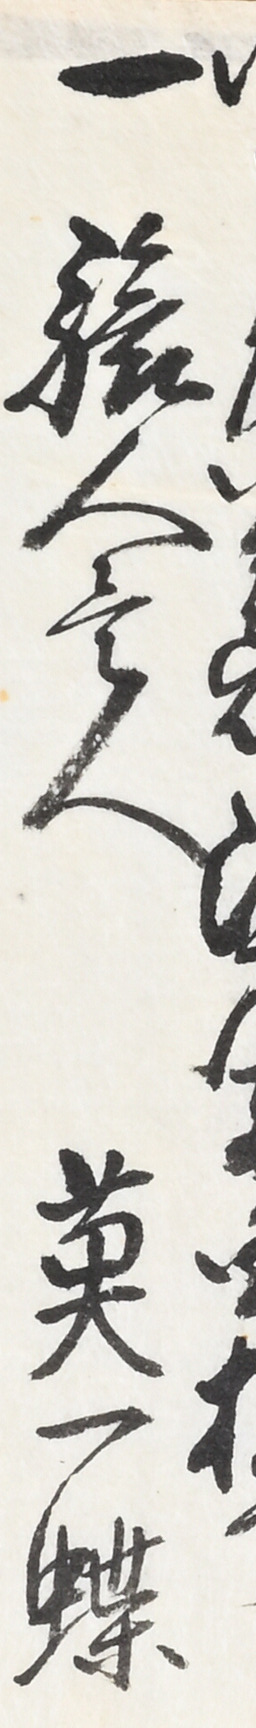一旅人壱人莫一蝶
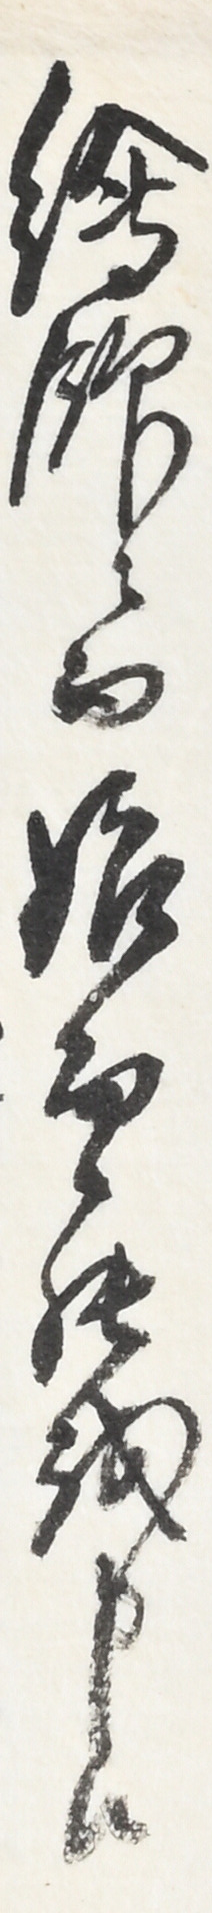絵師ニ而始而罷越申候
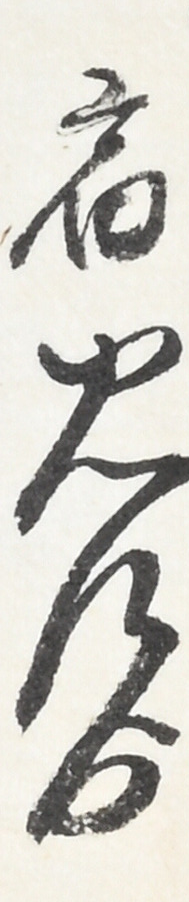宿忠左衛門

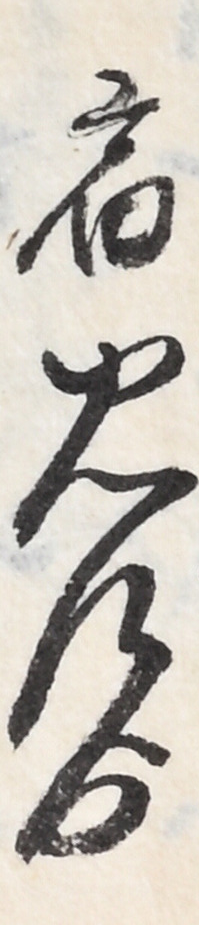宿籐左衛門
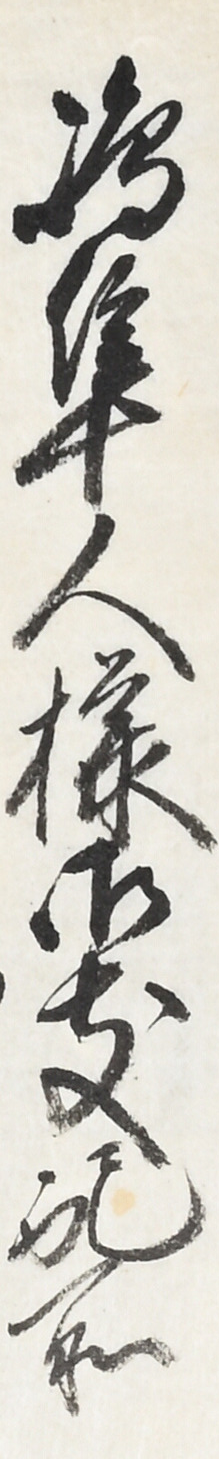嶋隼人様御支配所
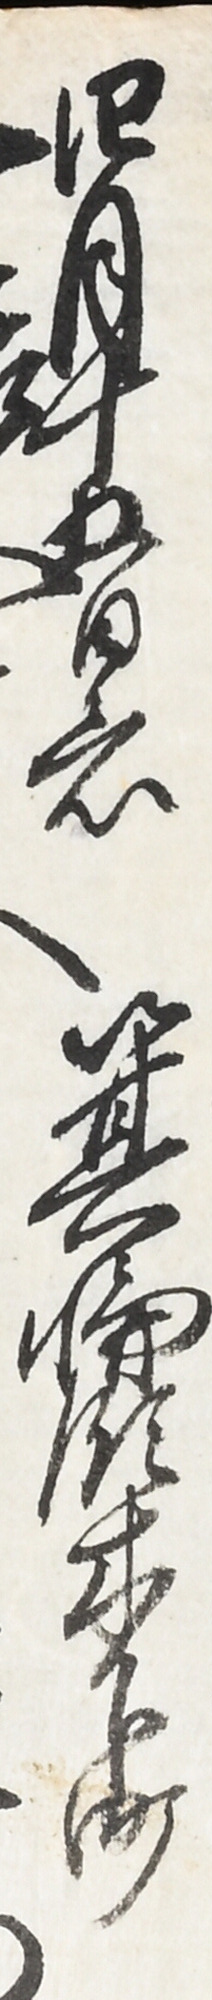四月十五日着箕輪領木下町
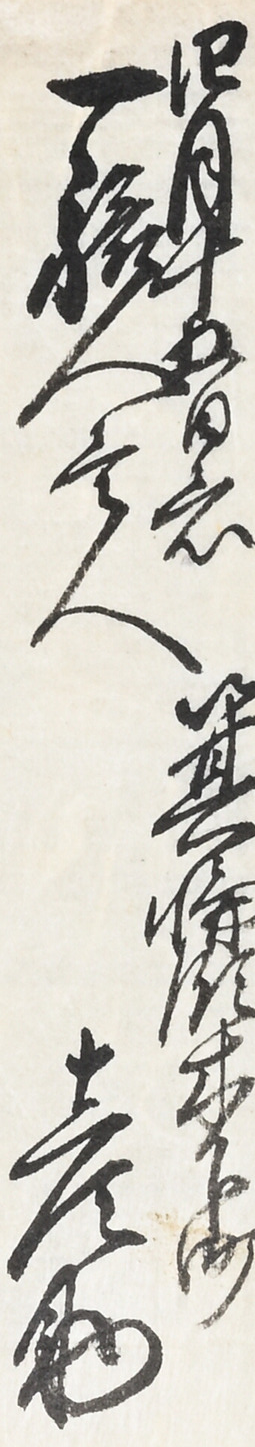一旅人弐人彦助
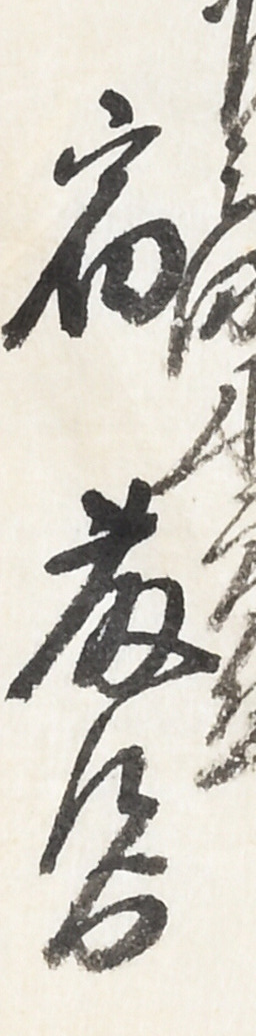宿籐左衛門
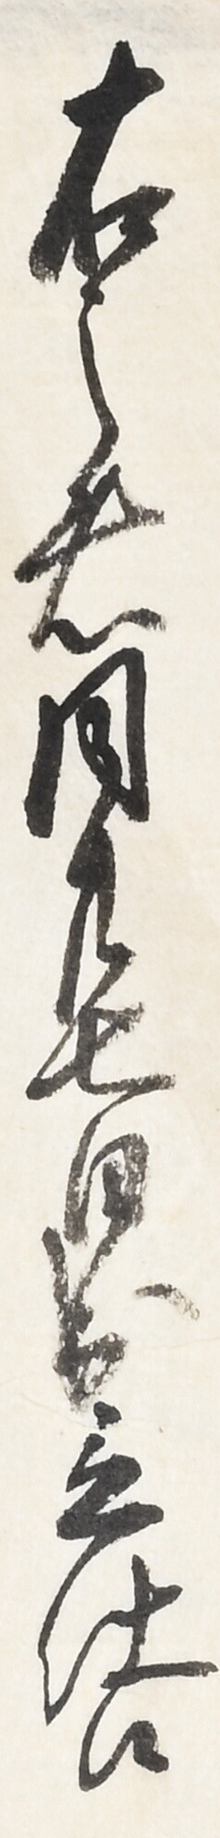右之者同廿七日出立仕候
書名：旅人泊控帳
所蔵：伊那市立高遠町図書館・合同会社AMANE
